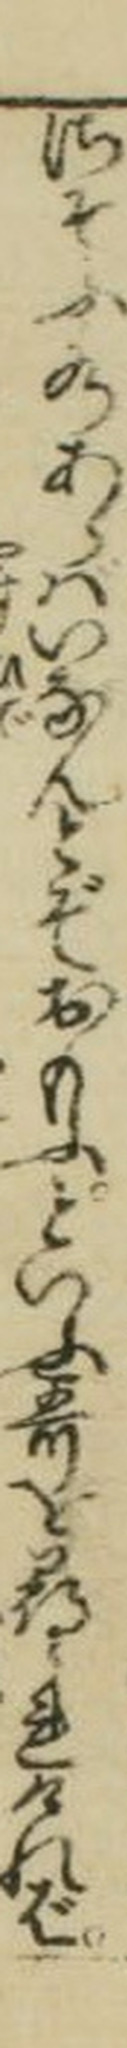さそふ水あらばいなんとぞおもふ。といふ哥を尋られければ。
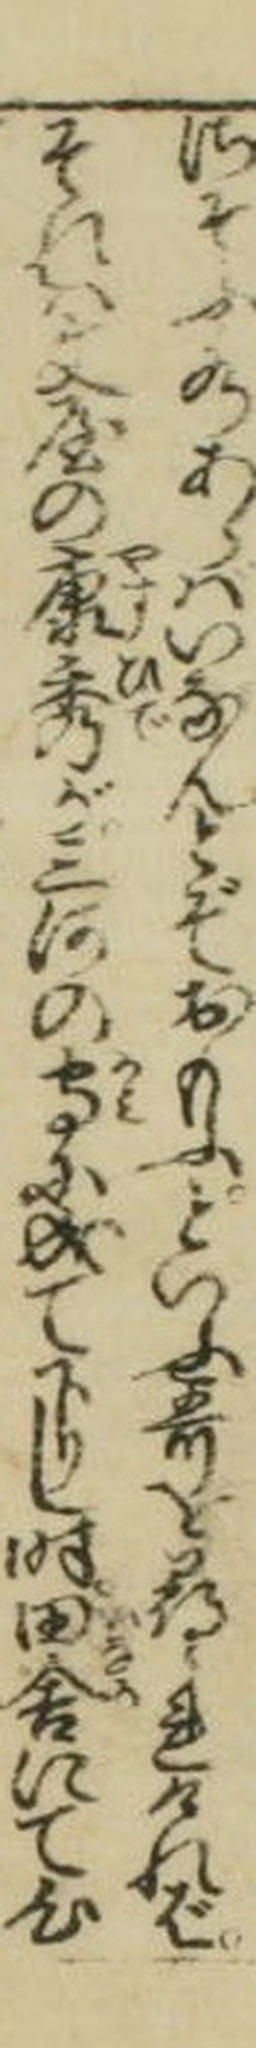それは文屋の康秀が三河の守に成て下りし時。田舎にて心
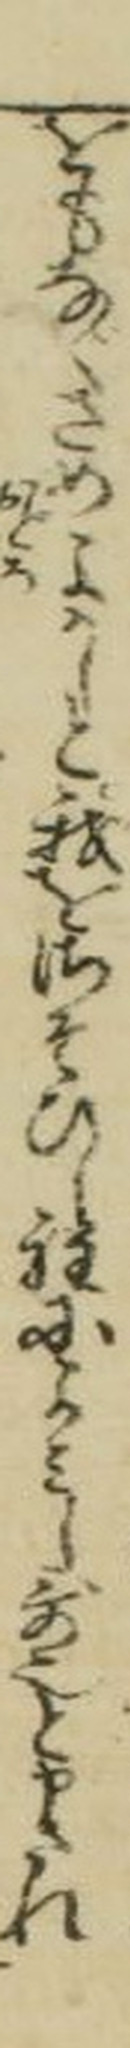をもなぐさめようと我をさそひし程によみし哥也と申され
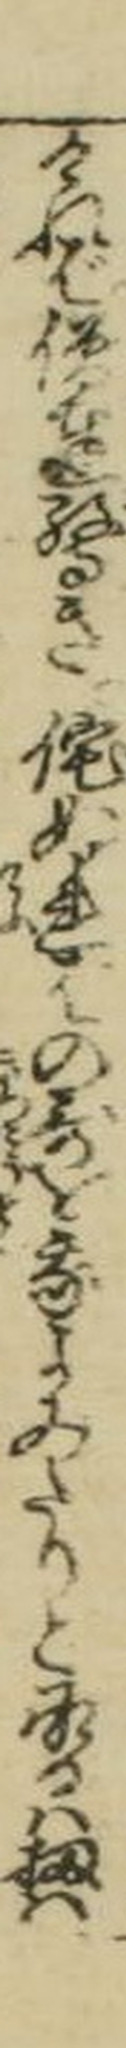ければ。僧達驚き。侘びぬればの哥を我よみたりと承るは扨は
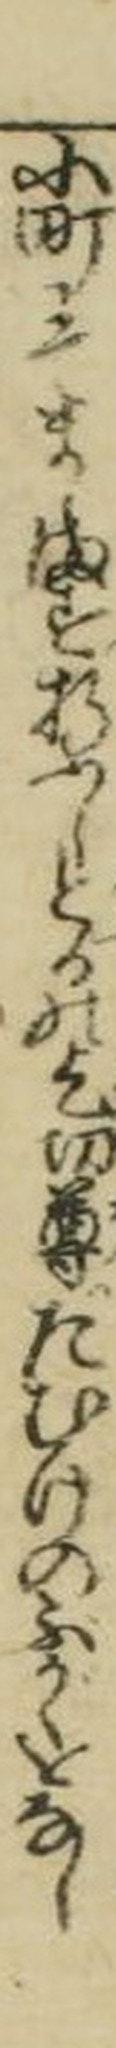小町にてまします折ふし今日の乞切尊。たむけのぶがくをなし
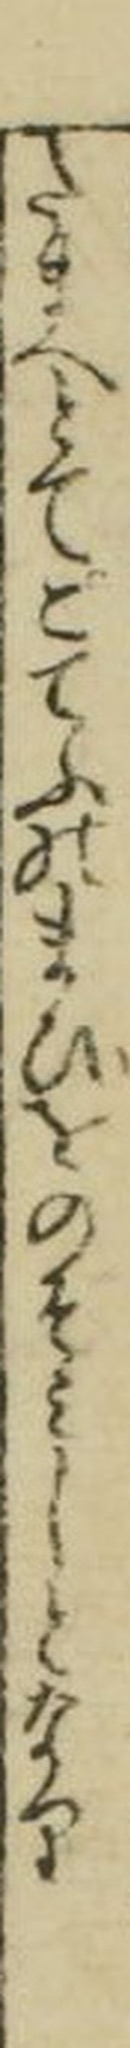たまへとてこてふのまひをのそみしとなり
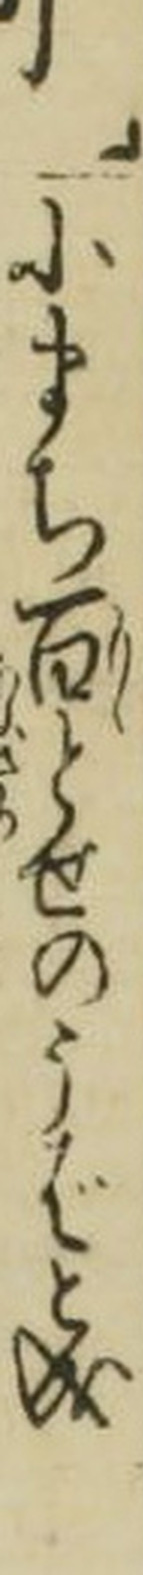こまち百とせのうばと成
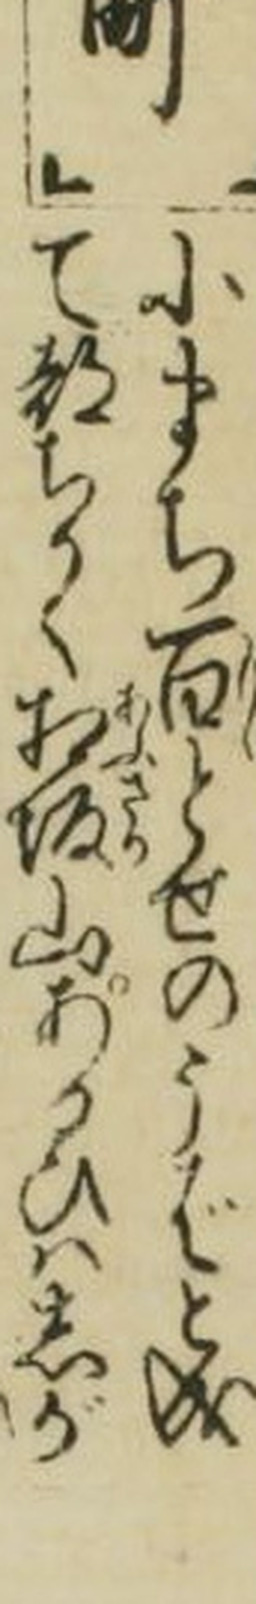て都ちかく相坂山。あるひはしが
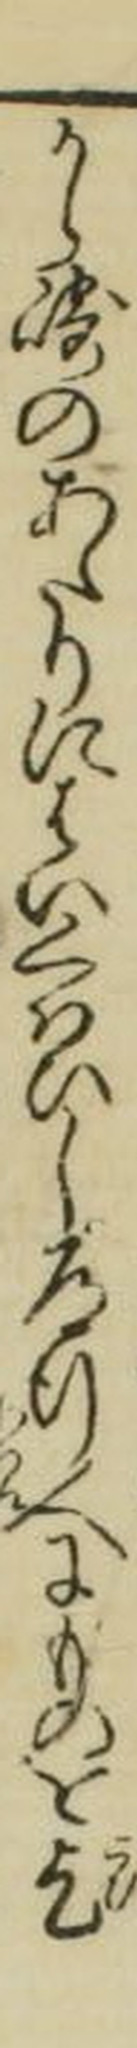から崎のあたりにはいくはひし。道行人にものを乞
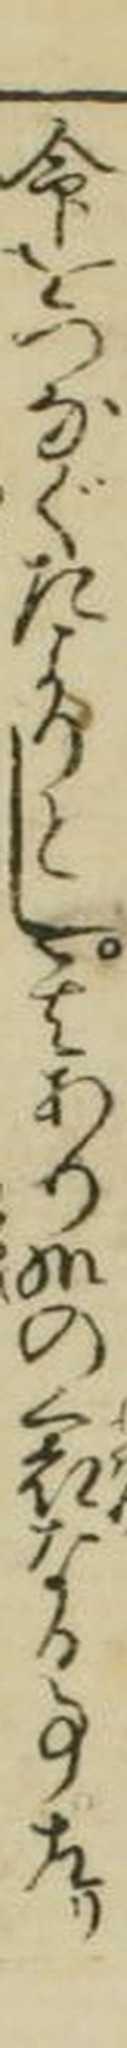命をつなぐたよりとし。其あり様の哀なる事左り
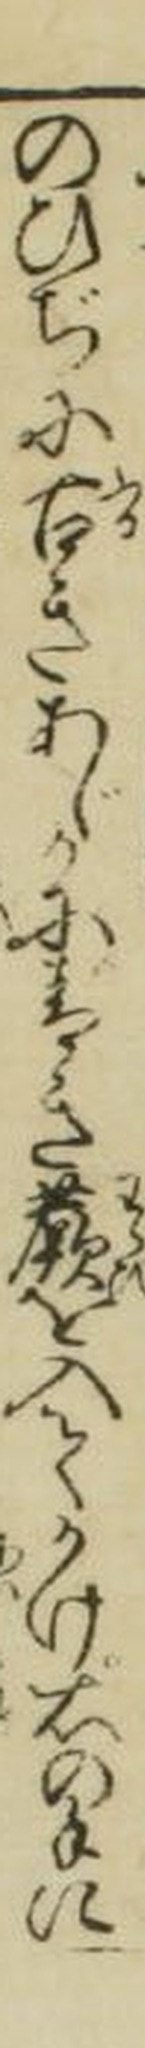のひぢに古きあじかに青き蕨を入てかけ。右の手に
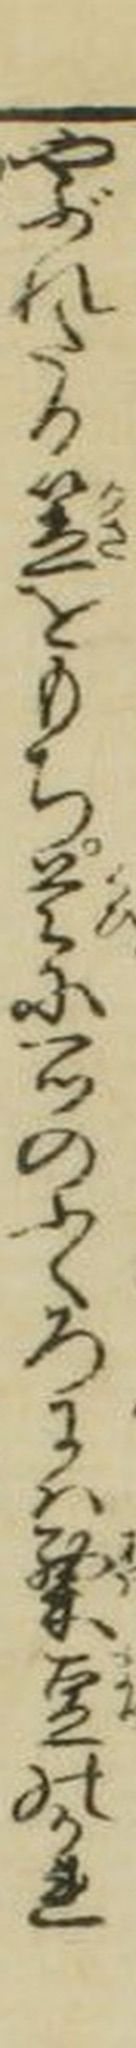やぶれたる笠をもち。首に一ツのふくろには粟豆のかれ
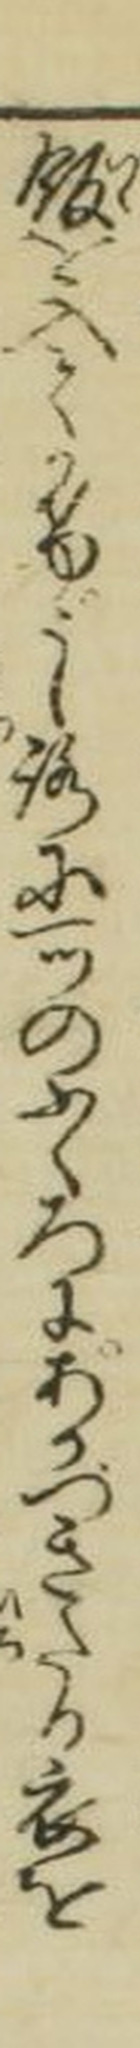飯を入てかけ。うしろに一ツのふくろに。あかづきたる
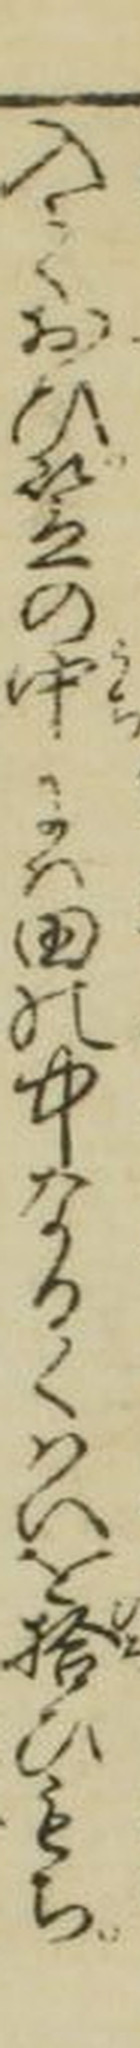入ておひ。笠の中には田の中なるくはいを拾ひもち。
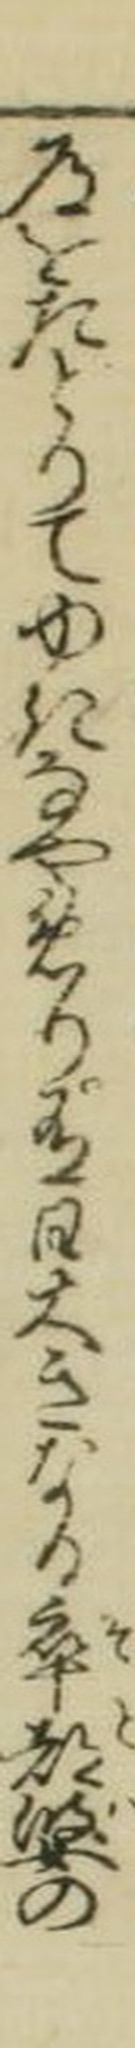道をたとりてゆきなやめり。有日大きなる卒都婆の
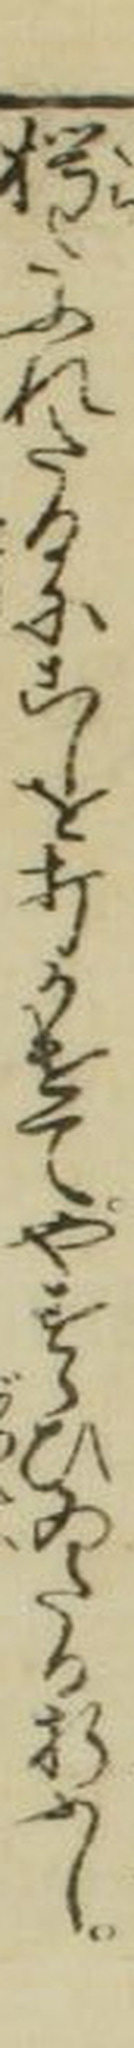朽たふれたるにこしを打かけて。やすらひゐたる折ふし。
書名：女源氏教訓鑑
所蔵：東京学芸大学附属図書館
